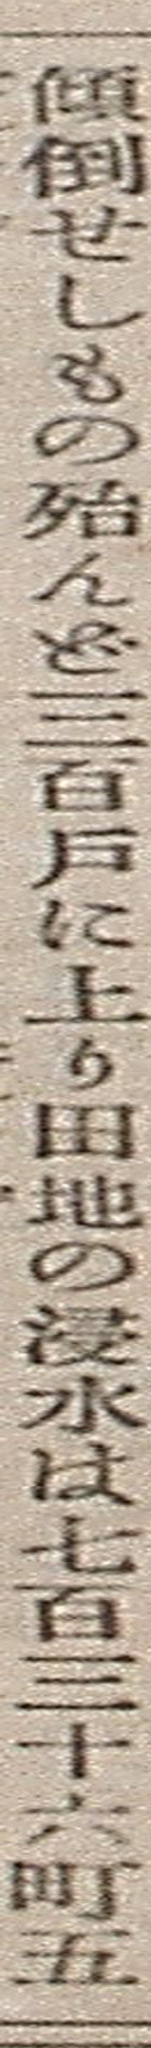傾倒せしもの殆んど三百戸に上り田地の浸水は七百三十六町五
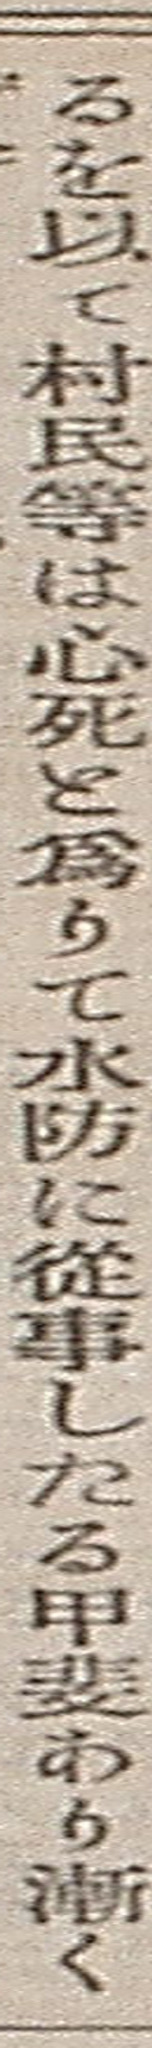るを以て村民等は必死と為りて水防に従事したる甲斐あり漸く
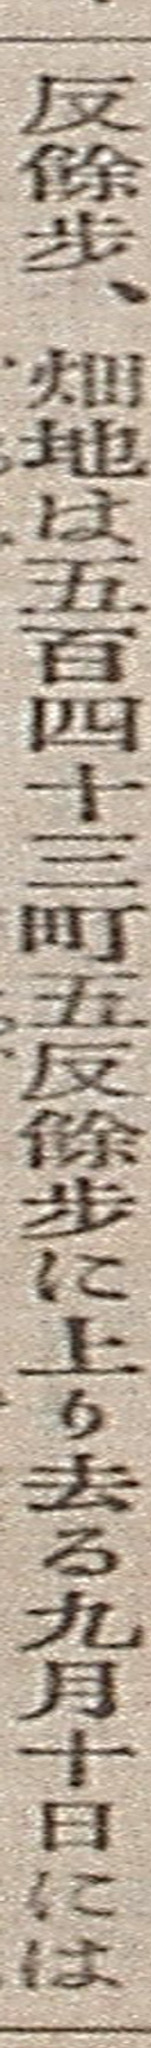反餘歩、畑地は五百四十三町五反餘歩に上り去る九月十日には
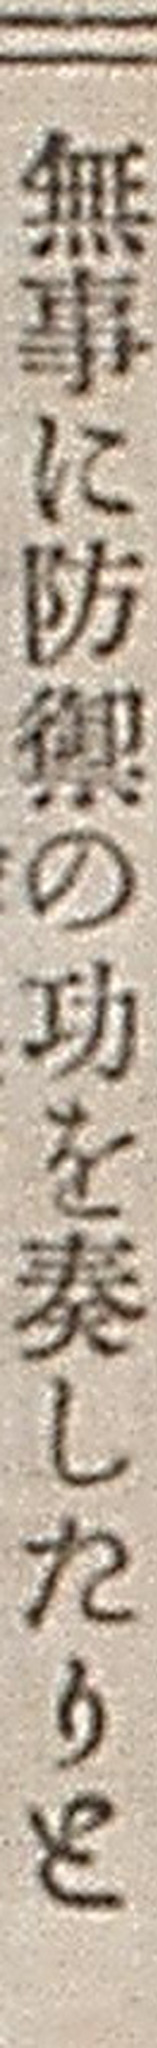無事に防禦の功を奏したりと
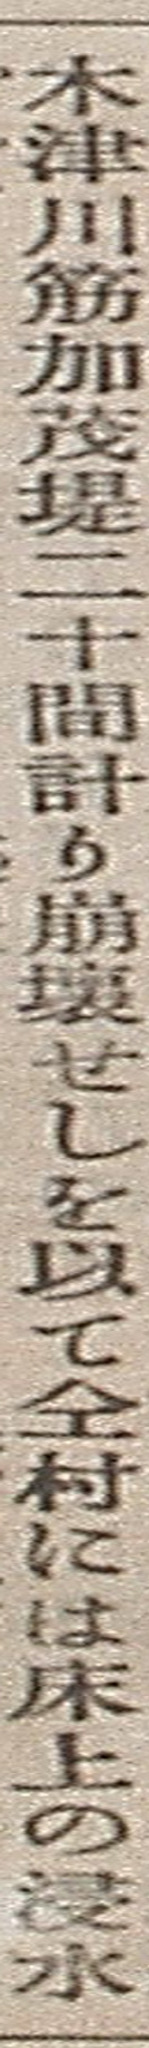木津川筋加茂堤二十間計り崩壊せしを以て同村には床上の浸水
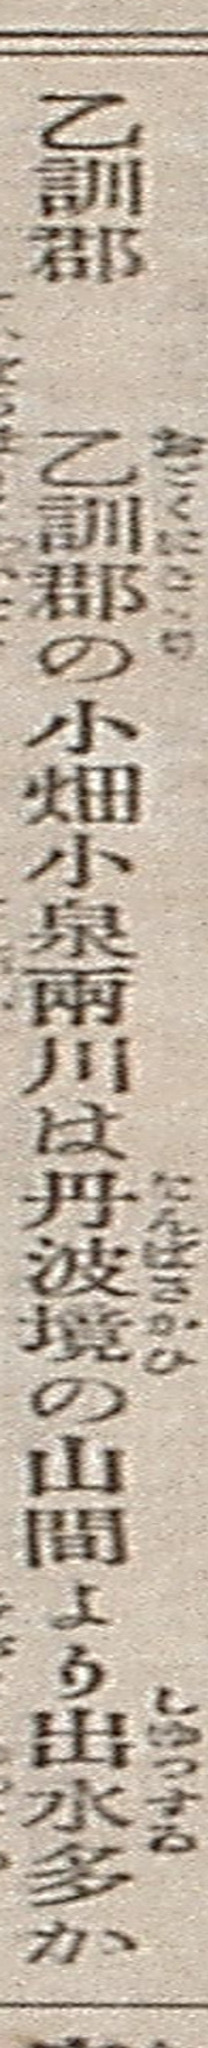乙訓郡乙訓郡の小畑小泉両川は丹波境の山間より出水多か
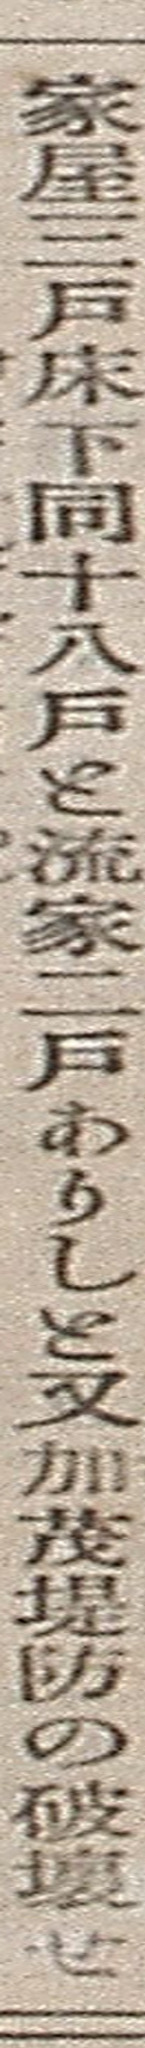家屋三戸床下同十八戸と流家二戸ありしと又加茂堤防の破壊せ
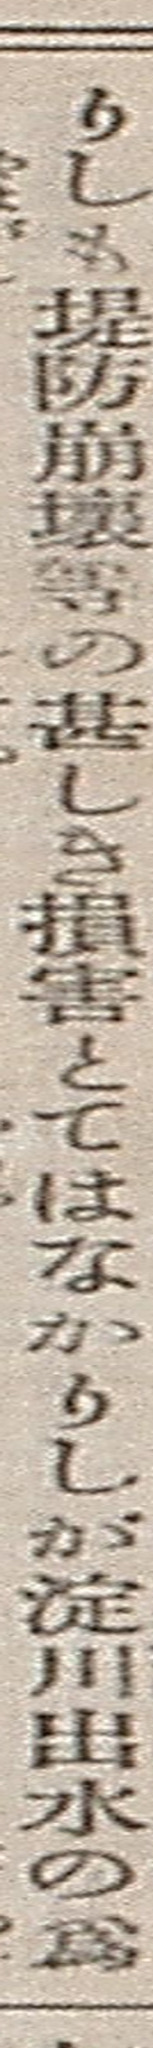りしも堤防崩壊等の甚しき損害とてはなかりしが淀川出水の為
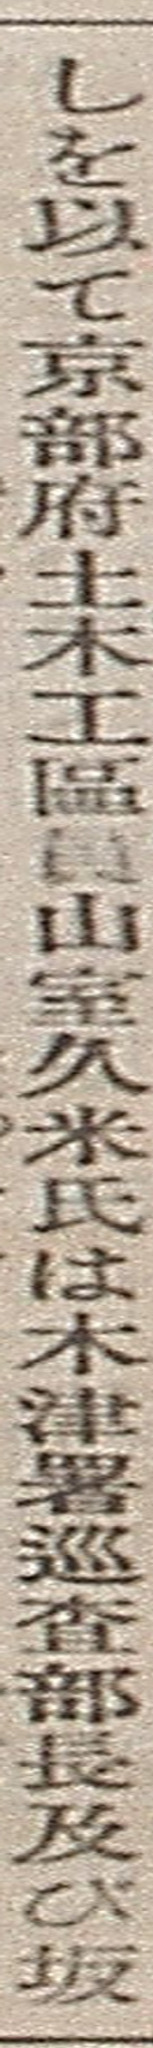しを以て京都府土木工區員山室久米氏は木津署巡査部長及び坂
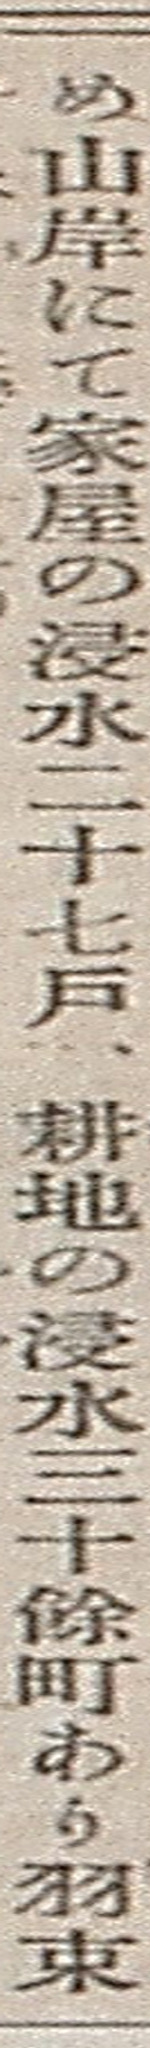め山岸にて家屋の浸水二十七戸、耕地の浸水三十餘町あり羽束
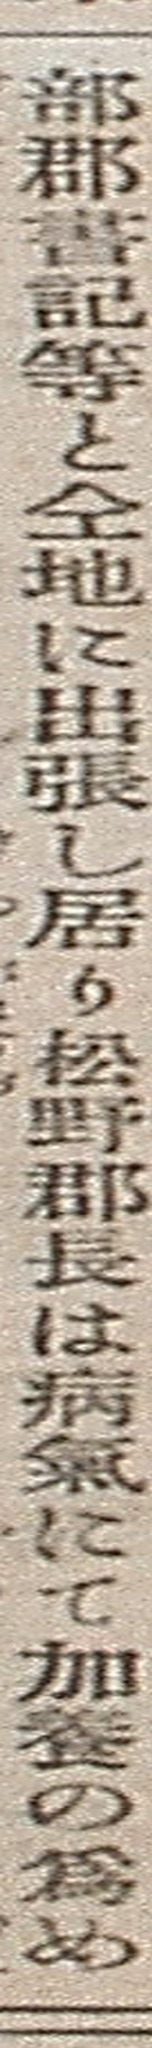部郡書記等と同地に出張し居り松野郡長は病気にて加養の為め
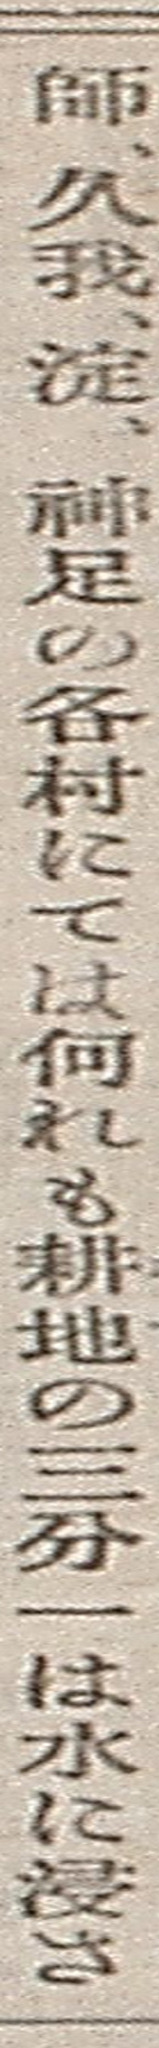師、久我、淀、神足の各村にては何れも耕地の三分一は水に浸さ
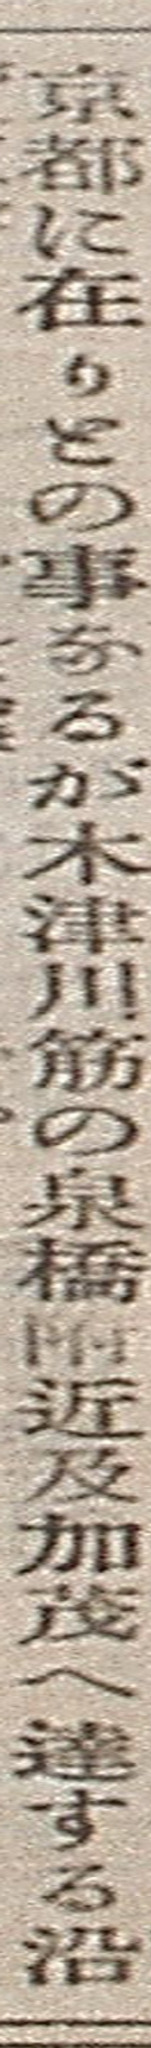京都に在りとの事なるが木津川筋の泉橋附近及加茂へ達する沿
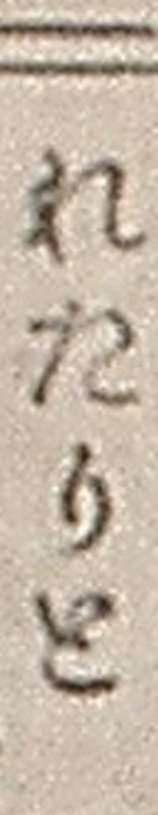れたりと
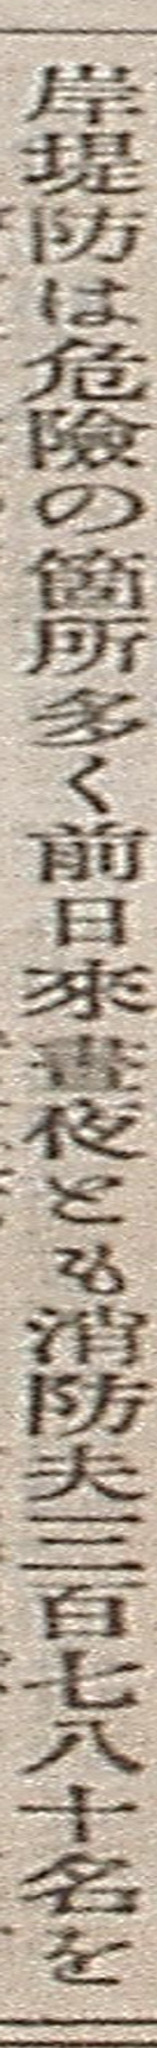岸堤防は危険の箇所多く前日來晝夜とも消防夫三百七八十名を
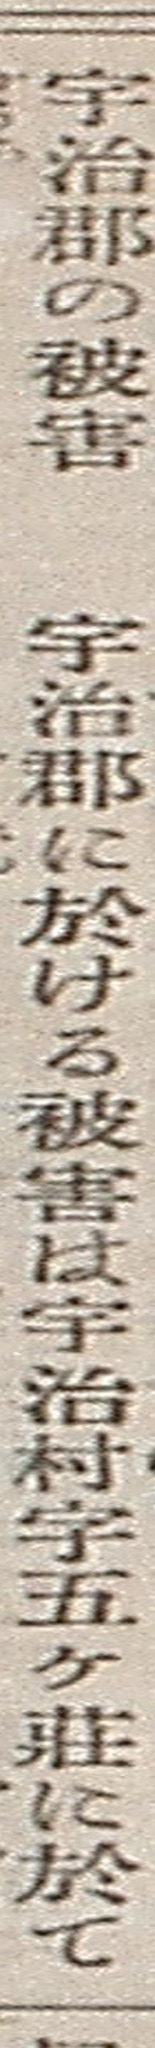宇治郡の被害宇治郡に於ける被害は宇治村字五ヶ荘に於て
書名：風俗畫報臨時増刊第百二十八號　洪水被害録（下）
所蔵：東京大学地震研究所図書室 Earthquake Research Institute Library, The University of Tokyo, JAPAN
